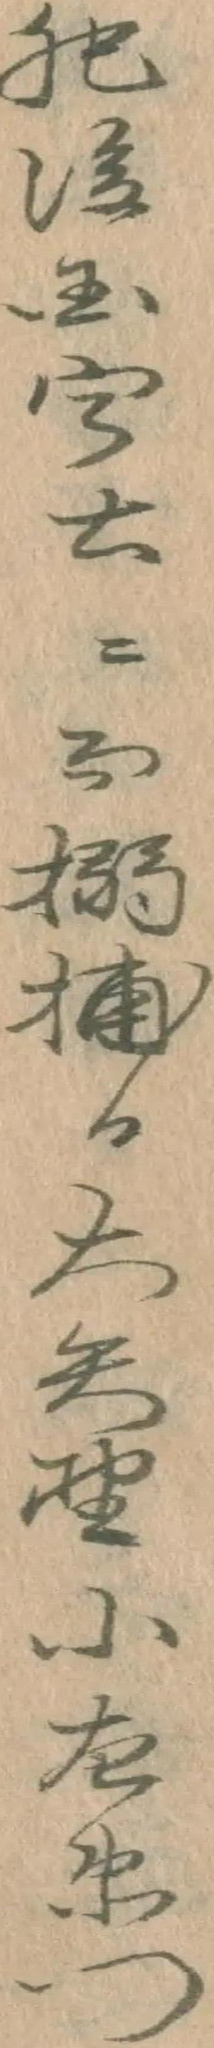肥後国宇土に而搦捕る大矢野小左衛門
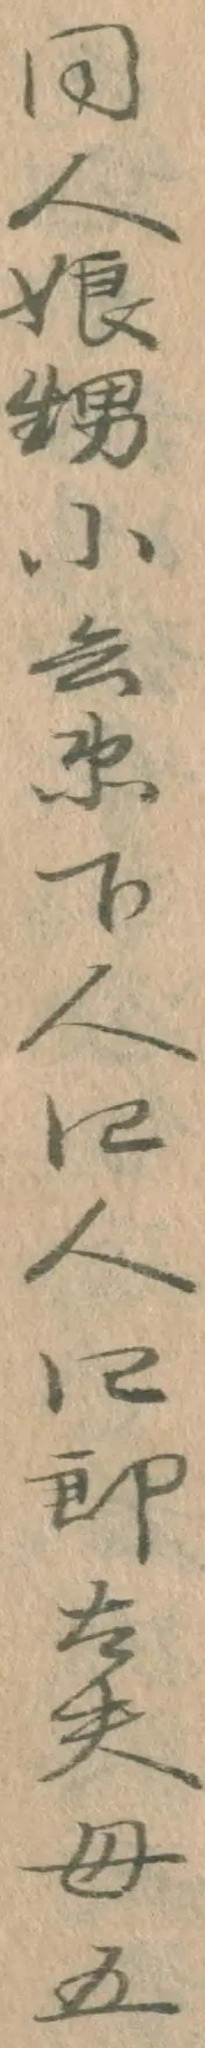同人娘甥小兵衛下人四人四郎太夫母五
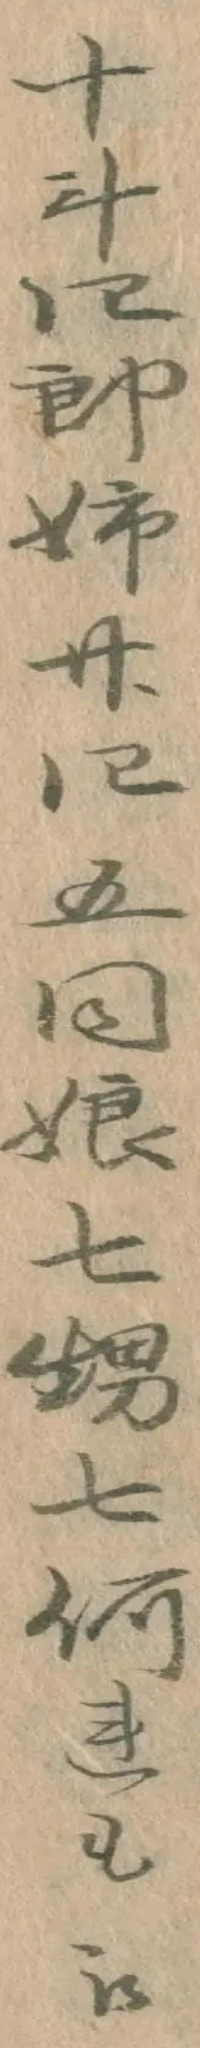十斗四郎姉廿四五同娘七甥七何連も被
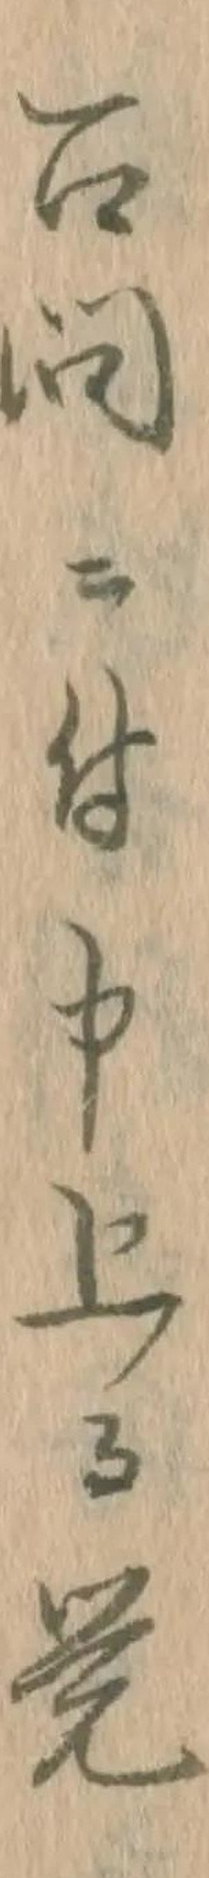召問に付申上る覚
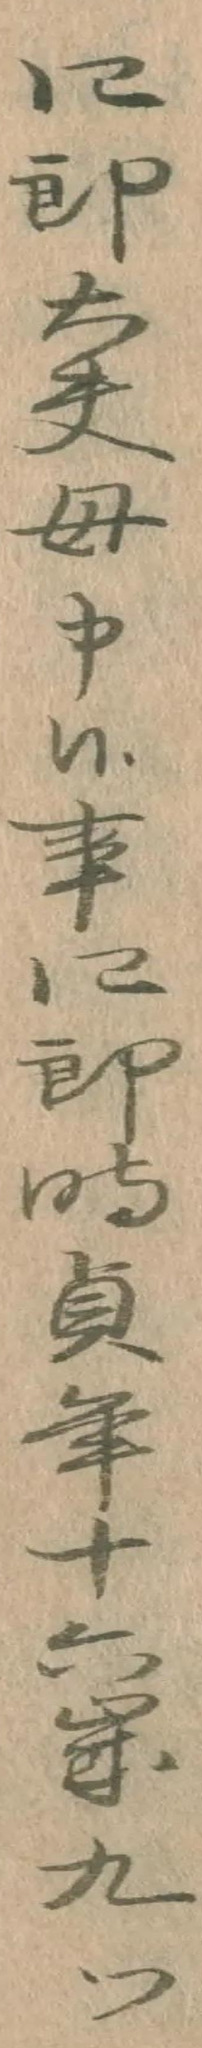一四郎太夫母申候事四郎時貞年十六歳九つ
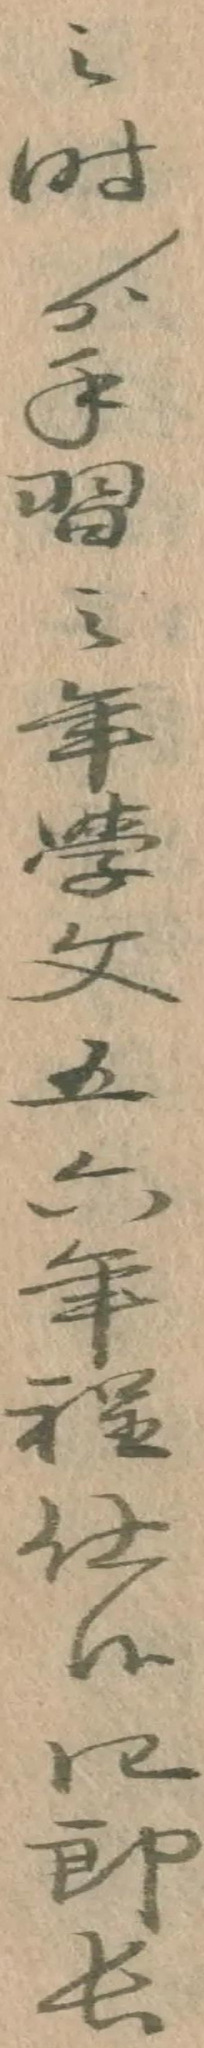之時ゟ手習之年学父五六年程仕候四郎長
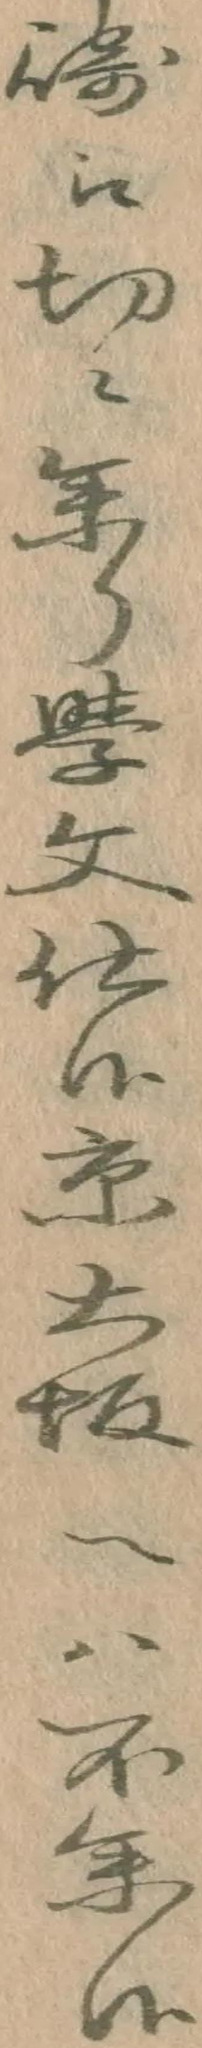崎江切々参り学父仕候京大坂へは不参候
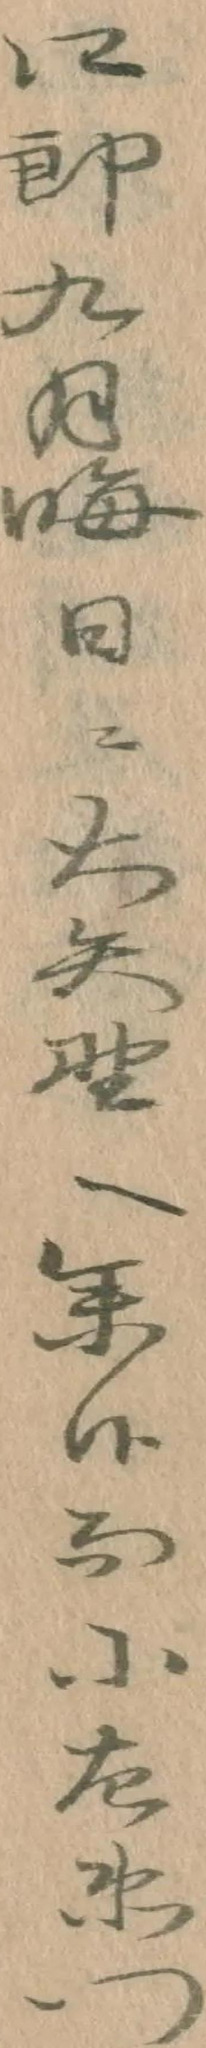四郎九月晦日に大矢野へ参候而小左衛門
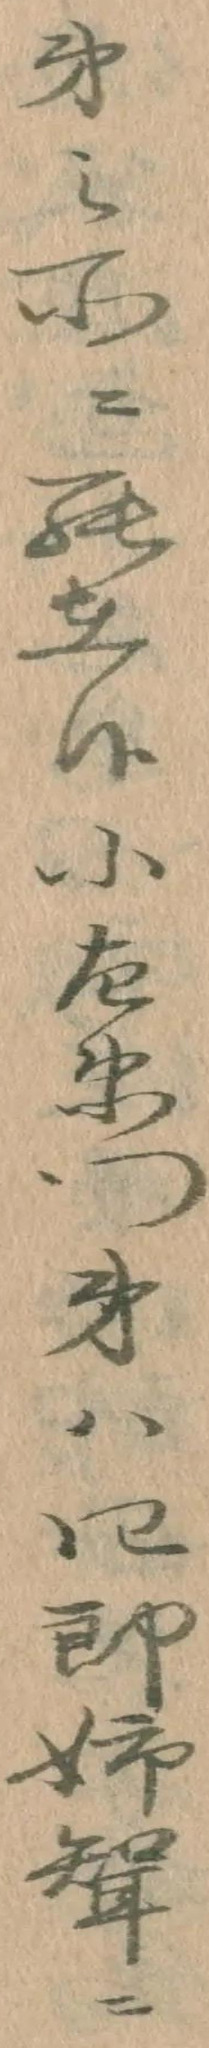弟之所に罷在候小左衛門弟は四郎姉聟に
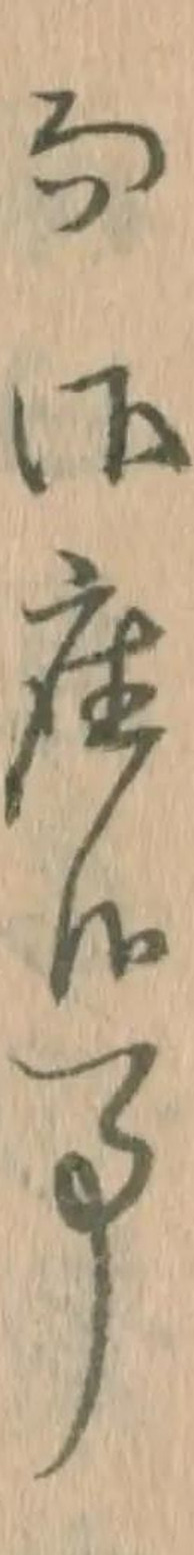而御座候事
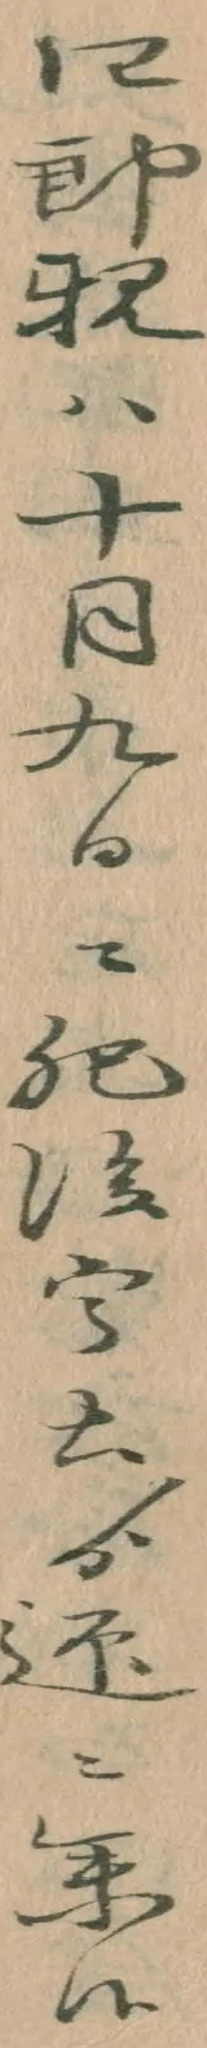一四郎親は十月九日に肥後宇土ゟ迎に参候
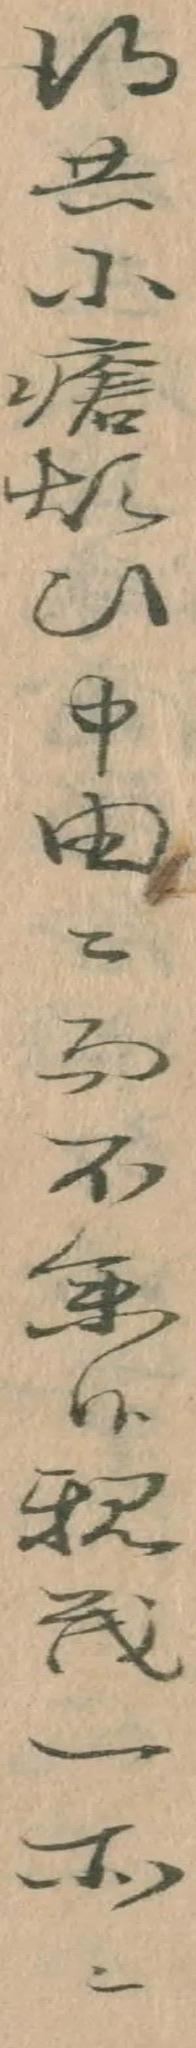得共小瘡煩ひ申由に而不参候親茂一所に
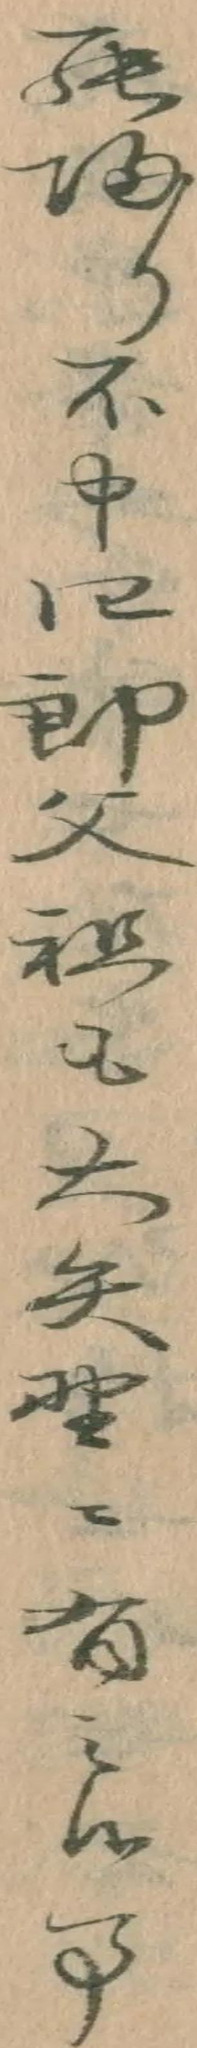罷帰り不申四郎父祖も大矢野に有之候事
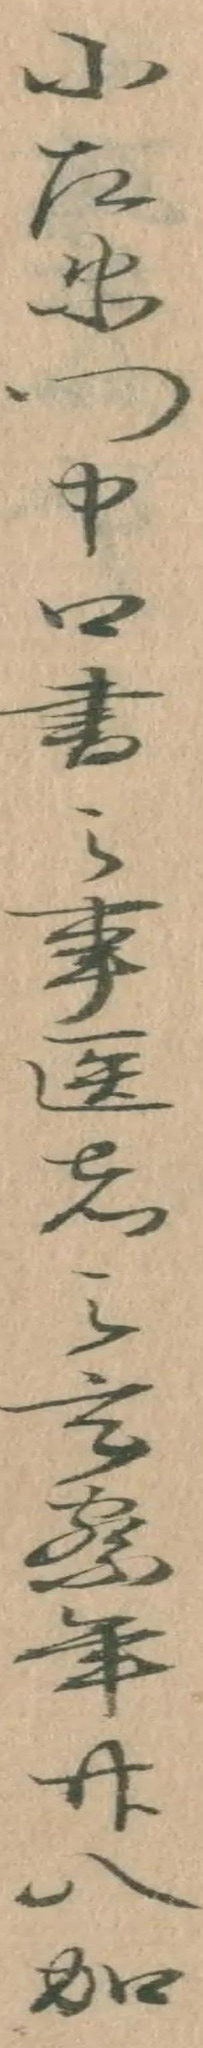一小左衛門申口書之事医者之玄察年廿八加
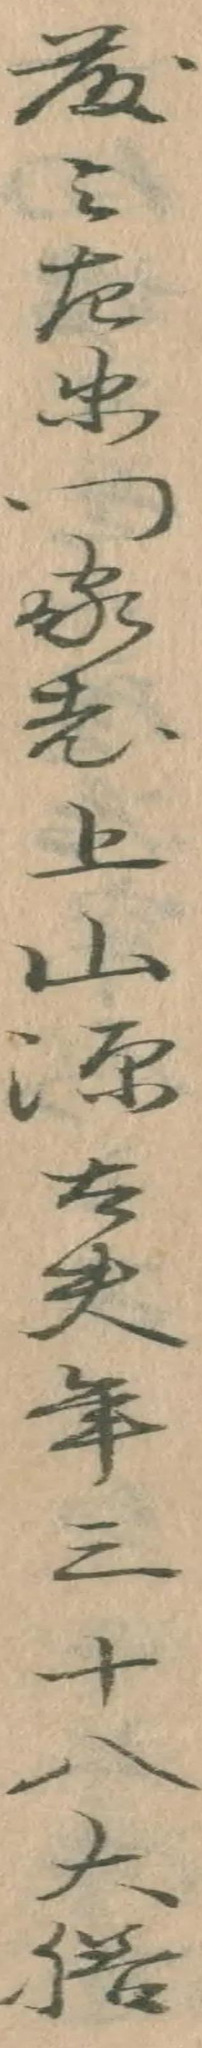藤与左衛門家老上山源太夫年三十八大膳
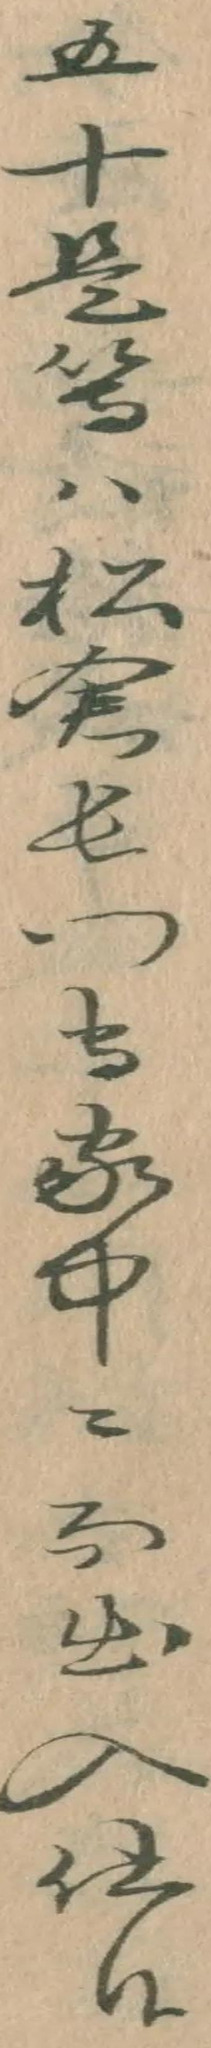五十是等は松倉長門守家中に而出入仕候
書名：切支丹御退治記 49巻. [2]
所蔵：国立国会図書館 National Diet Library, JAPAN
